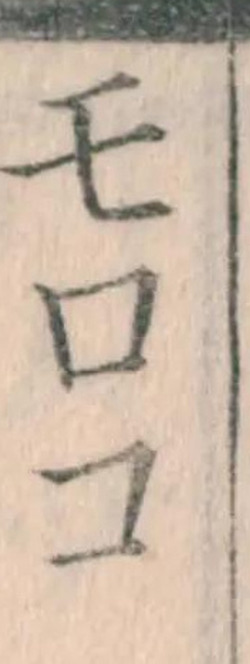モロコ
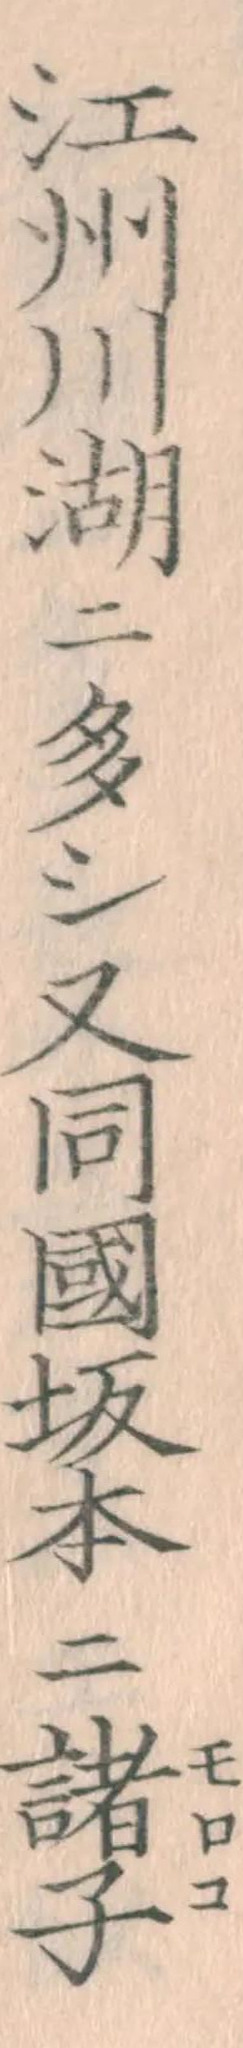江州川湖ニ多シ又同国坂本ニ諸子
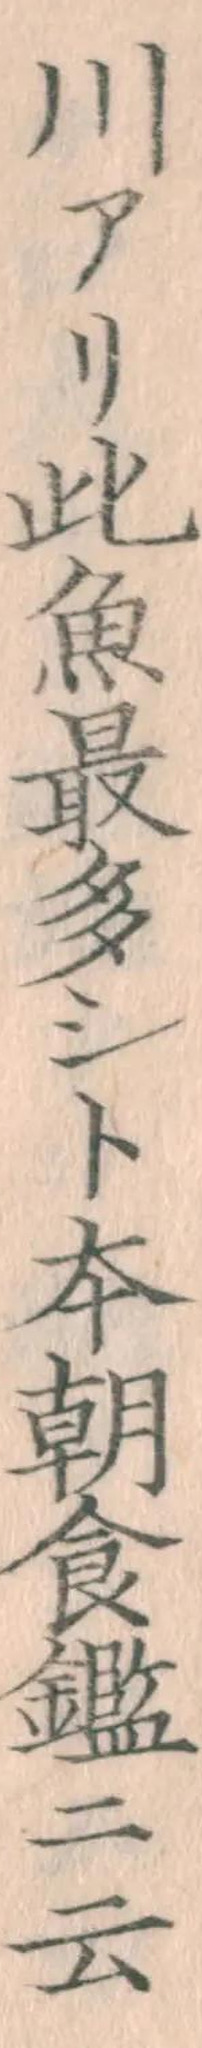川アリ此魚最多シト本朝食鑑ニ云
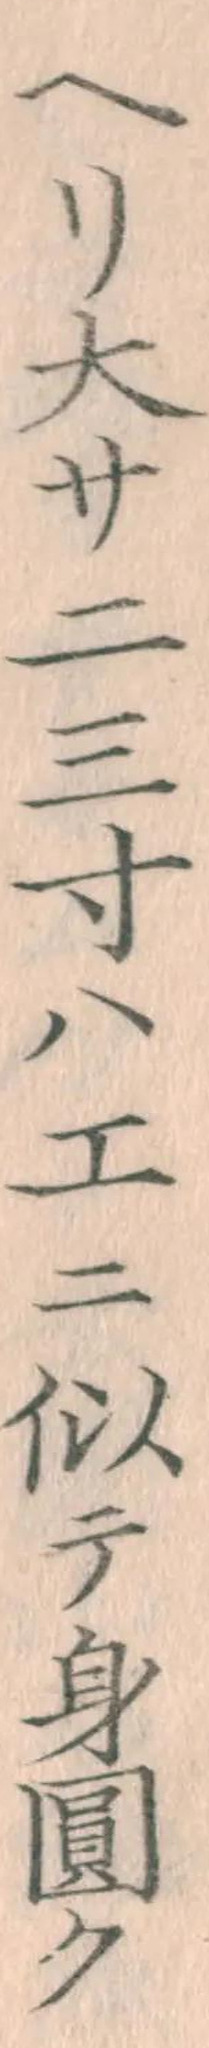ヘリ大サ二三寸ハエニ似テ身円ク
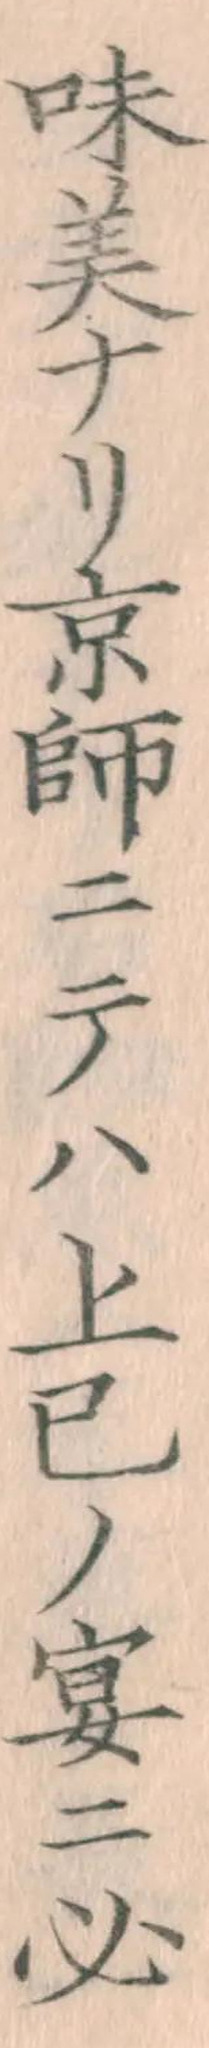味美ナリ京師ニテハ上巳ノ宴ニ必
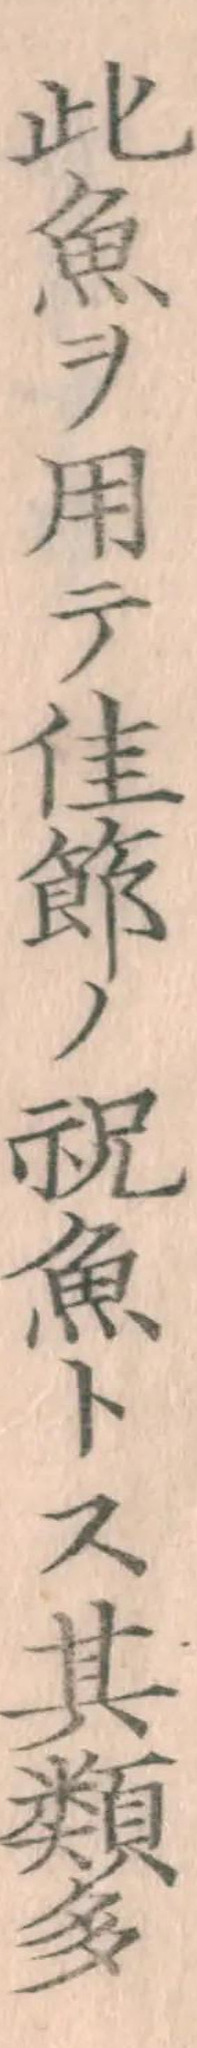此魚ヲ用テ佳節ノ祝魚トス其類多
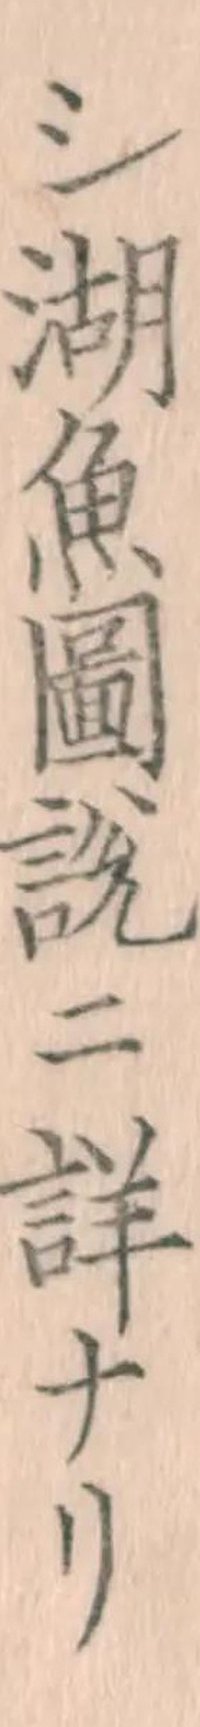シ湖魚図説ニ詳ナリ
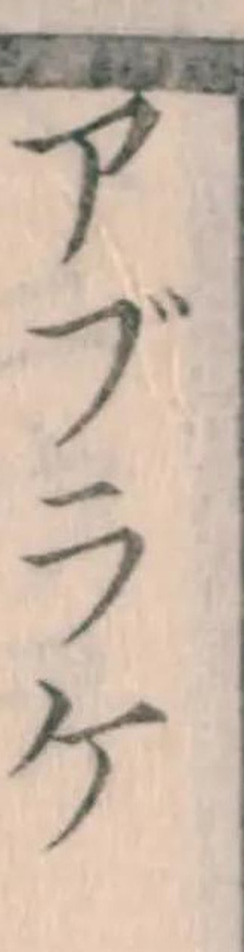アブラケ
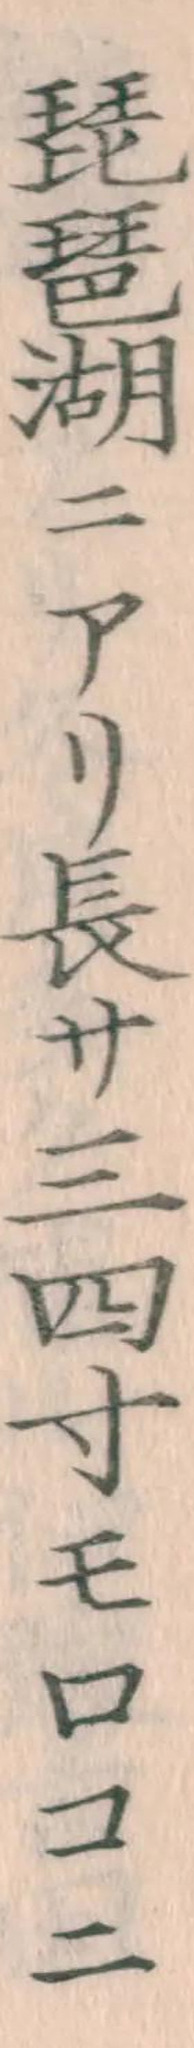琵琶湖ニアリ長サ三四寸モロコニ
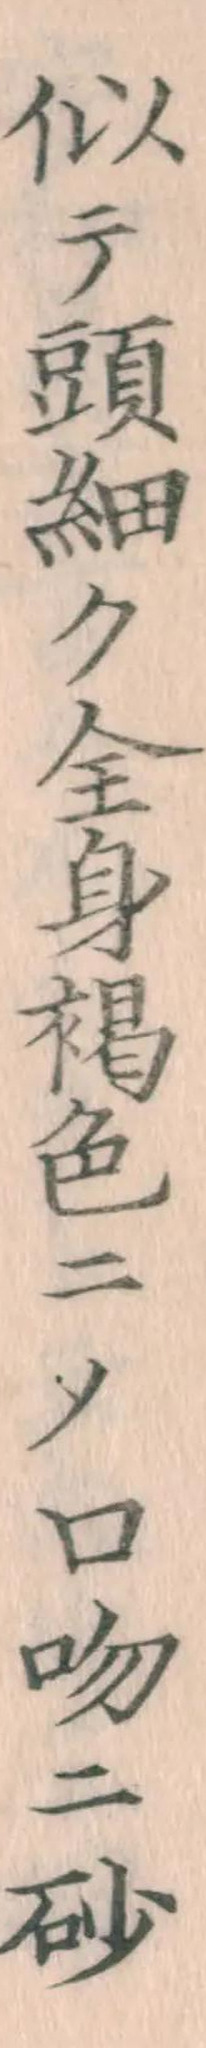似テ頭細ク全身褐色ニシテ口吻ニ砂
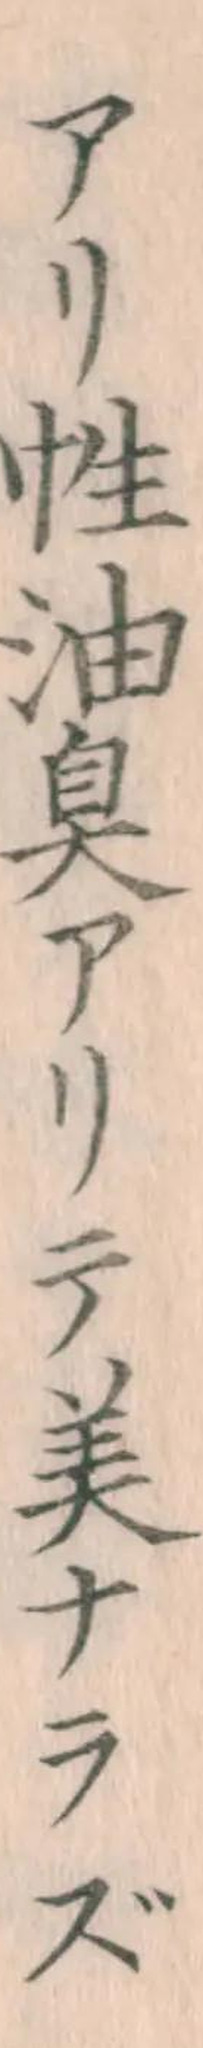アリ性油臭アリテ美ナラズ

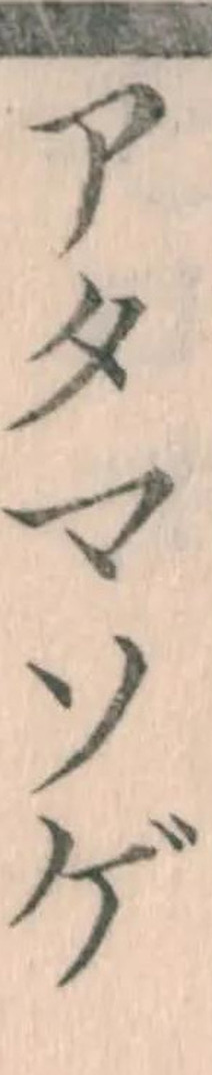アタマソゲ
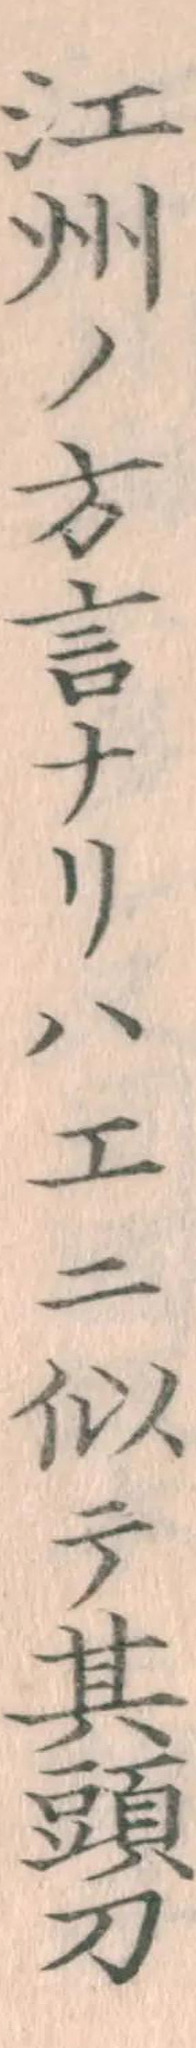江州ノ方言ナリハエニ似テ其頭刀
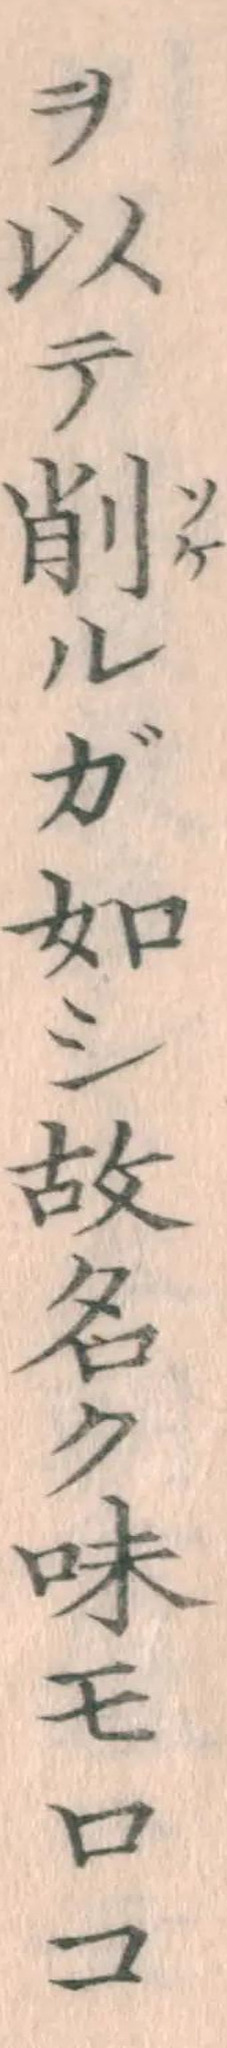ヲ以テ削ルガ如シ故名ク味モロコ
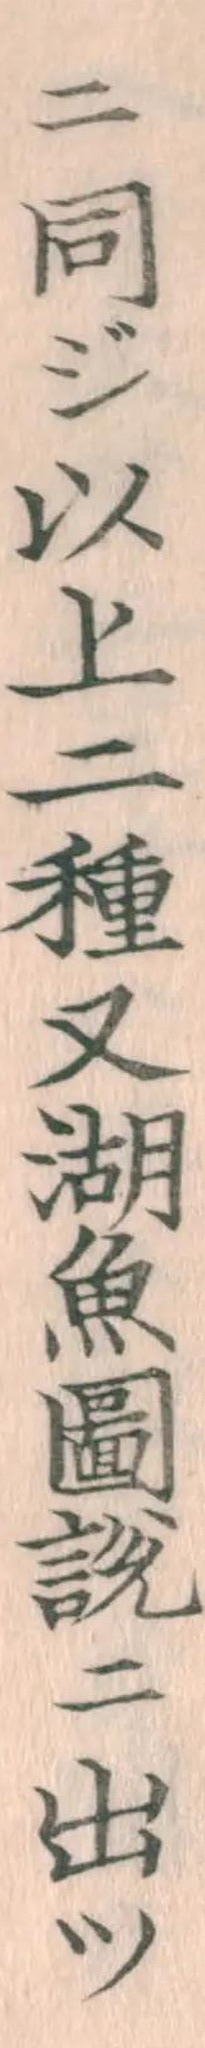ニ同ジ以上二種又湖魚図説ニ出ツ
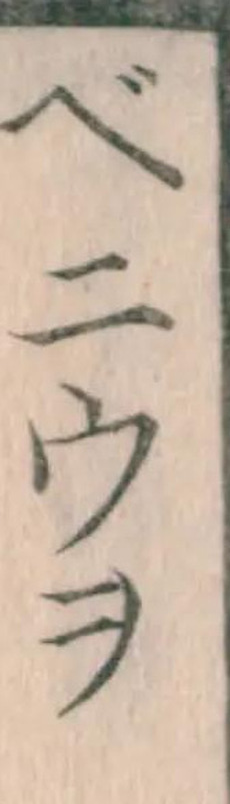ベニウヲ
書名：皇和魚譜 2巻
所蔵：国立国会図書館 National Diet Library, JAPAN
